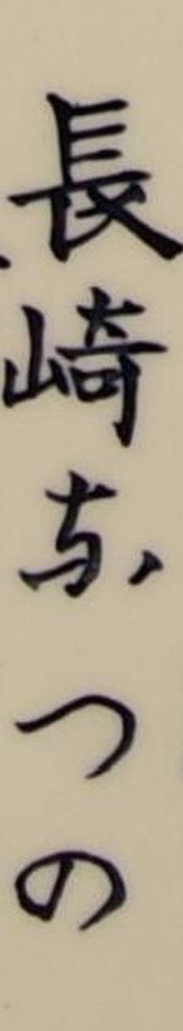長崎なつの
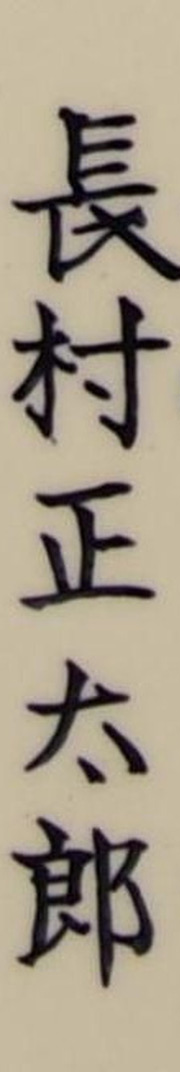長村正太郎
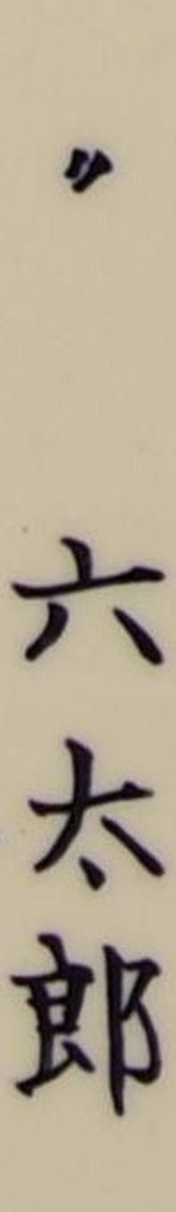六太郎
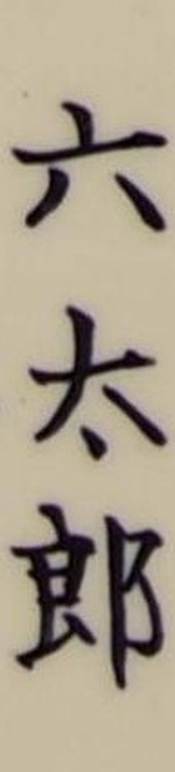六太郎
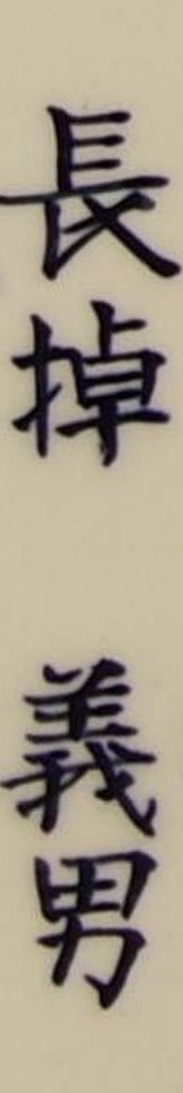長棹義男
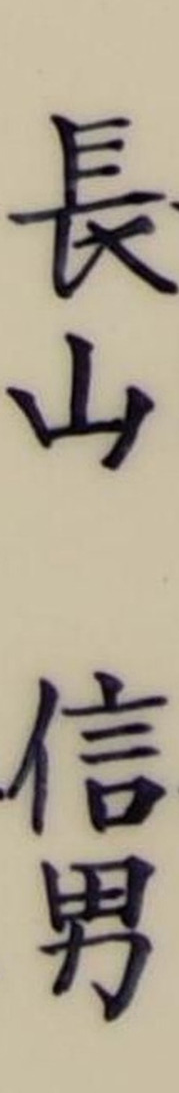長山信男
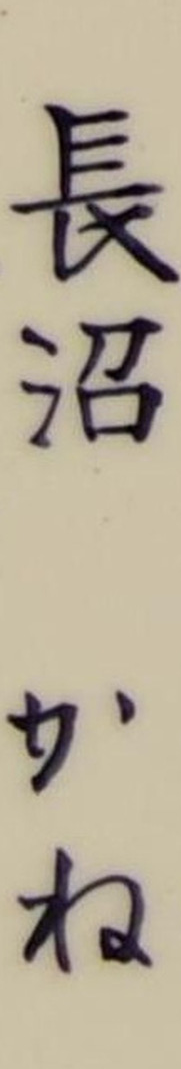長沼かね
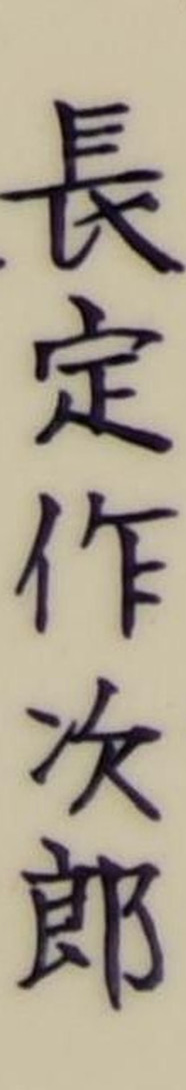長定作次郎
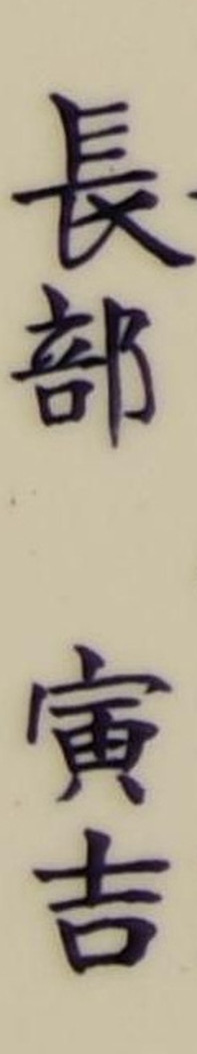長部寅吉
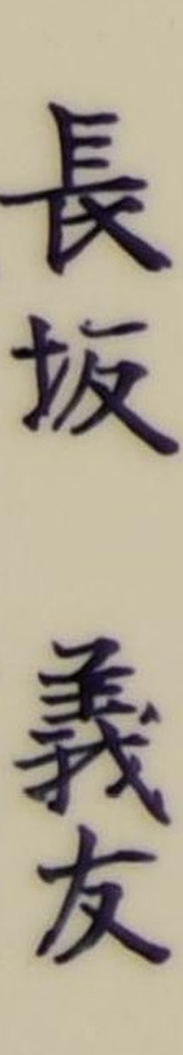長坂義友
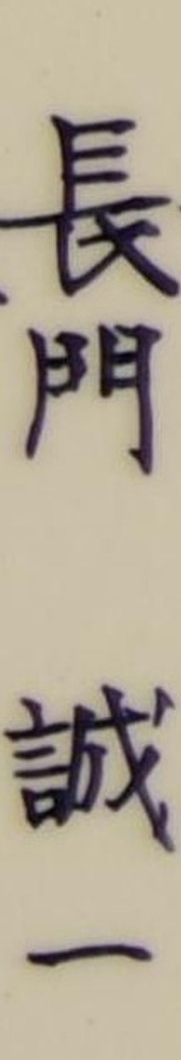長門誠一

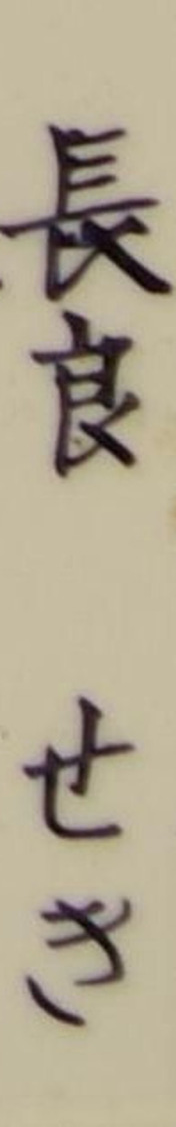長良せき
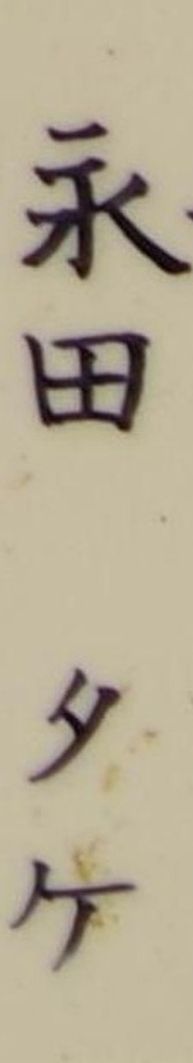永田タケ
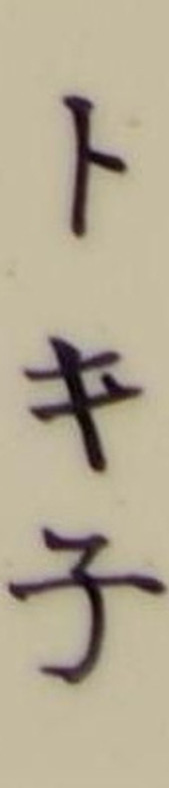トキ子
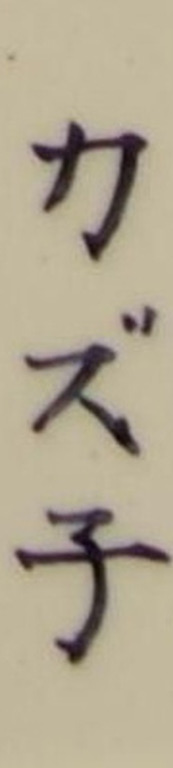カズ子
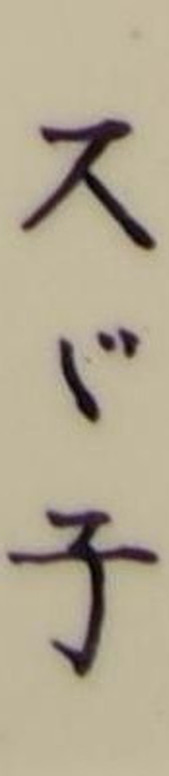スズ子
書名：A~D
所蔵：koyasan kongobuji
